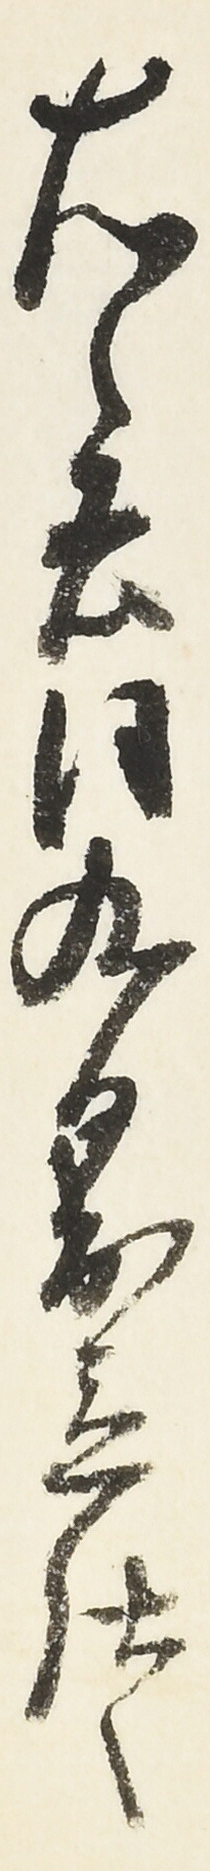右之者同九日出立仕候
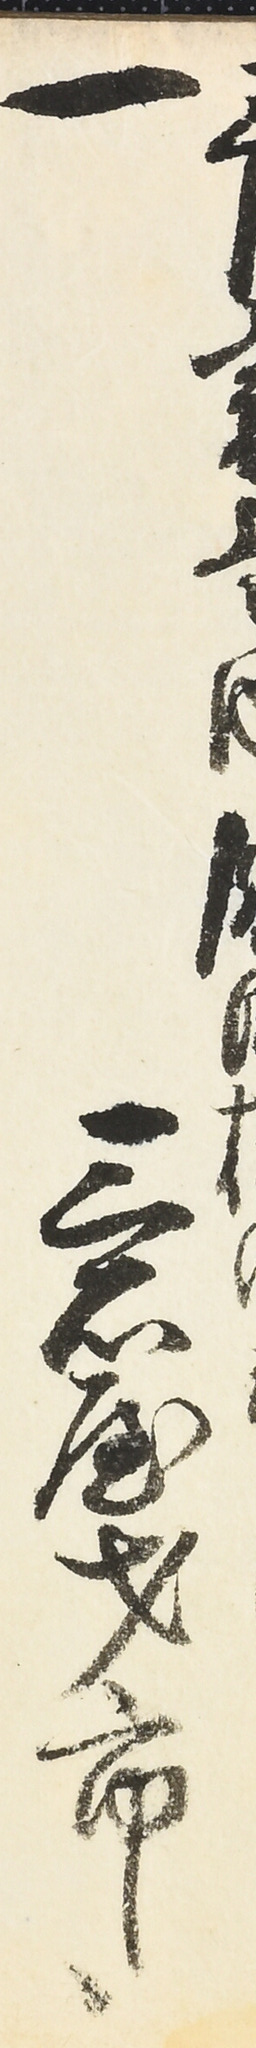一三石屋才市
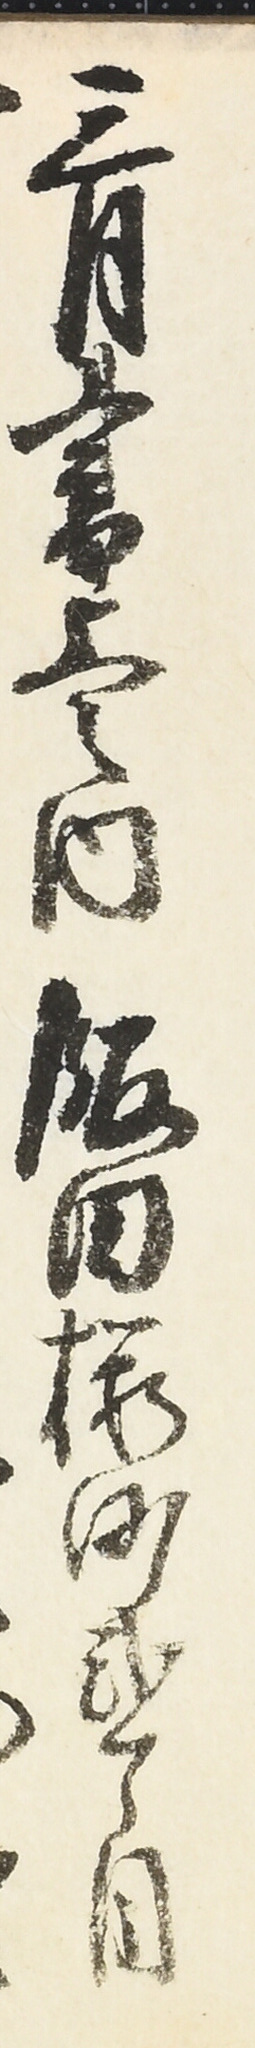三月書上之内飯田桜町弐丁目
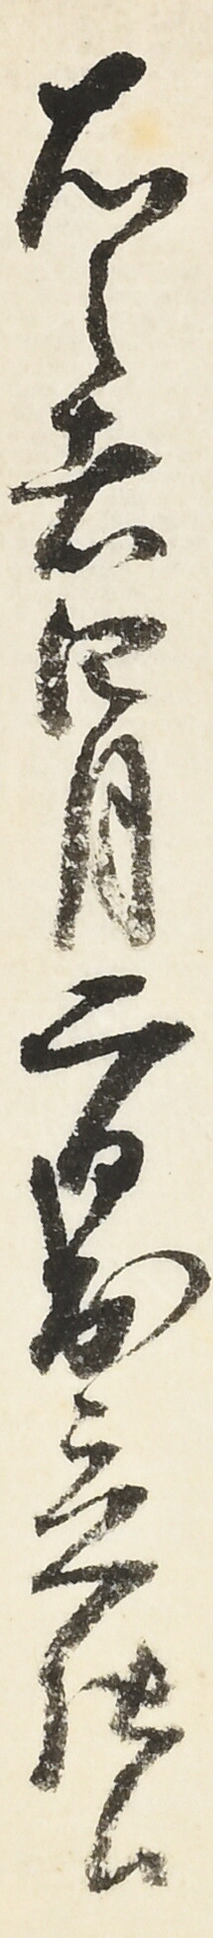右之者四月二日出立仕候

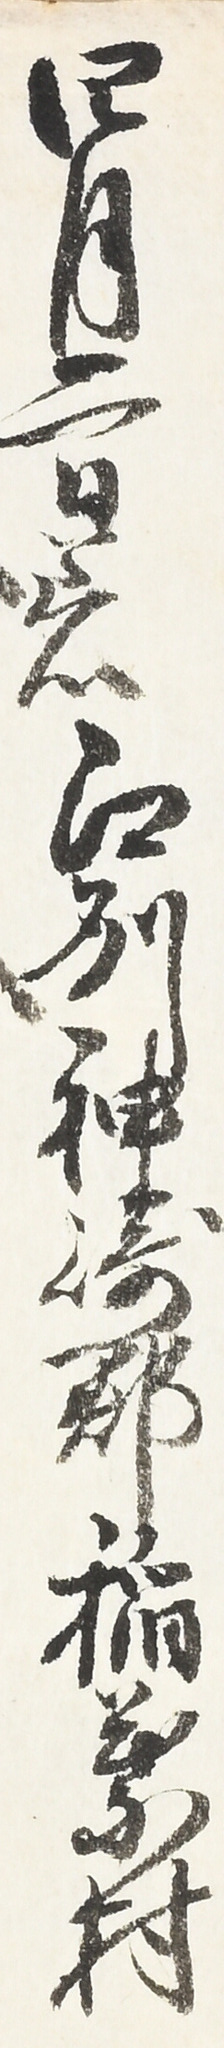四月二日着江州神崎郡稲葉村
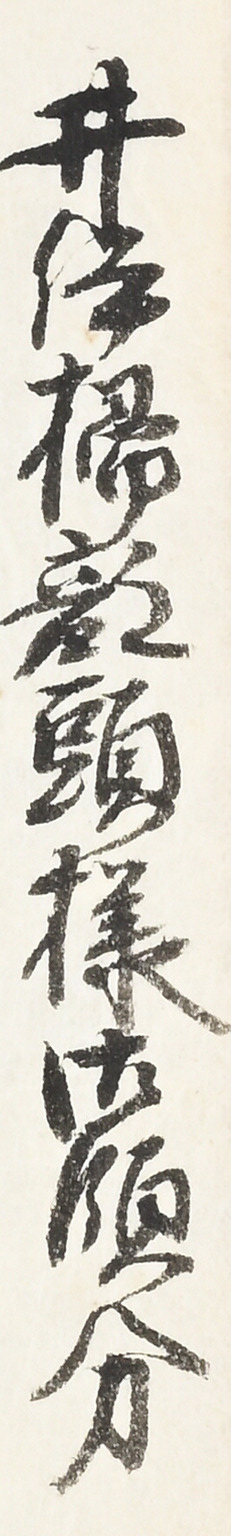井伊掃部頭様御領分
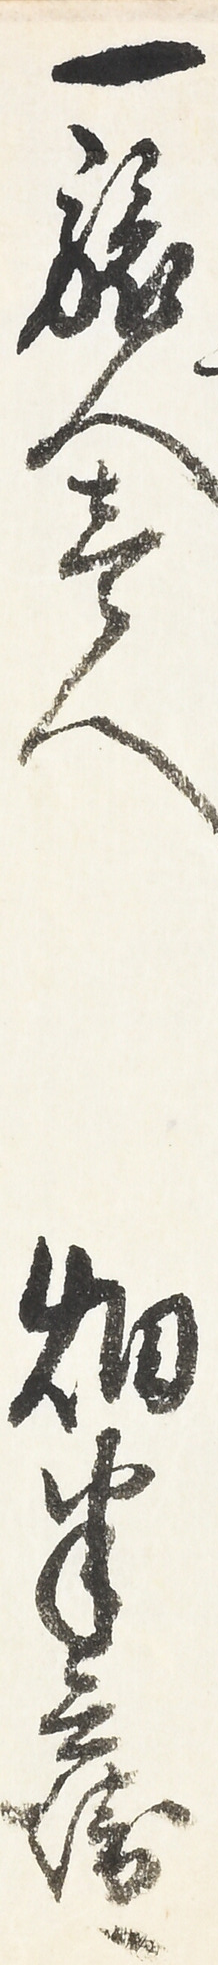一旅人壱人畑半兵衛・
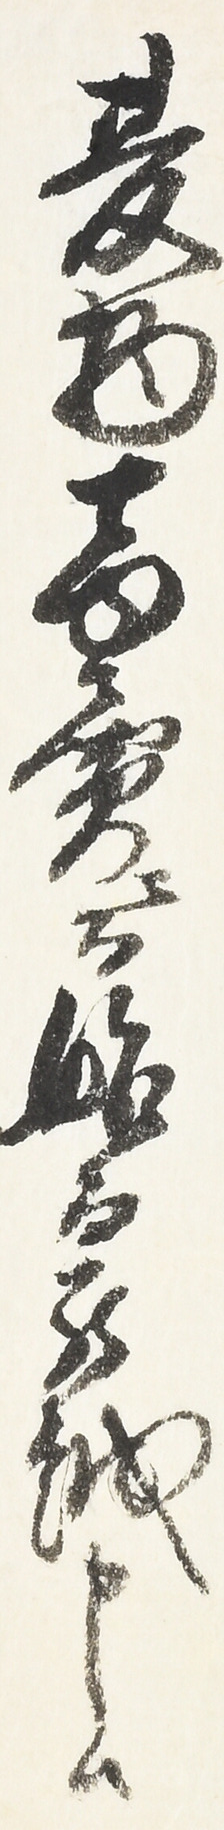夏物商売ニ而始而罷越申候
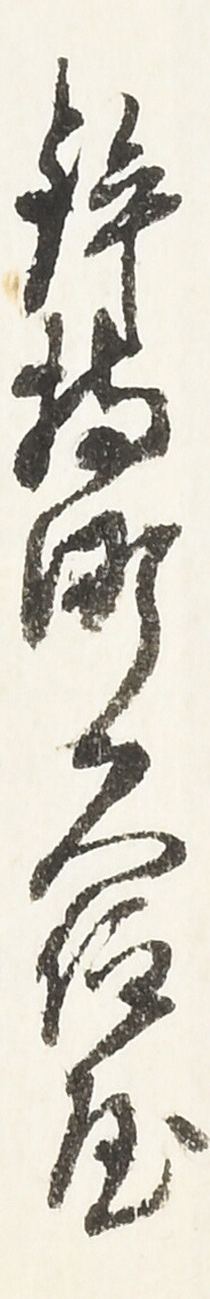鉾持町久住屋
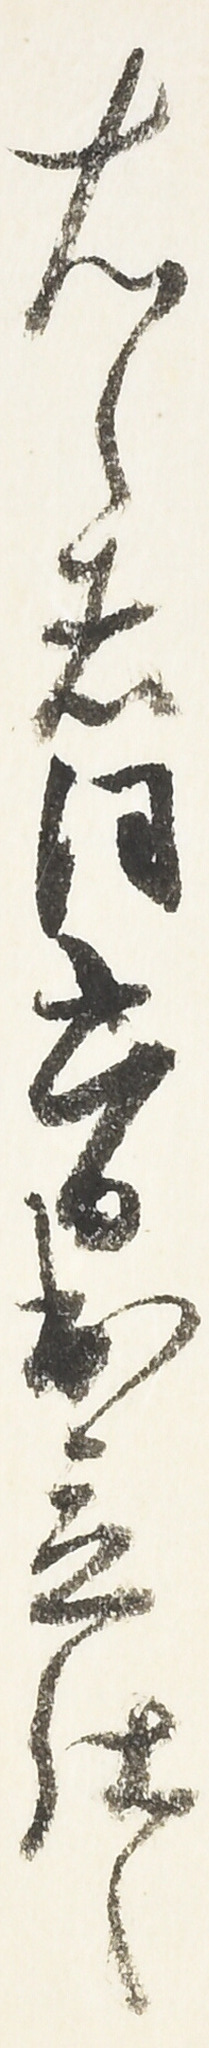右之者同六日出立仕候
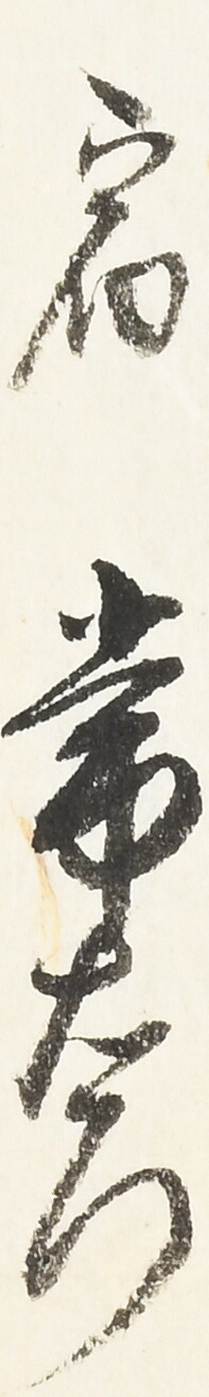宿常右衛門
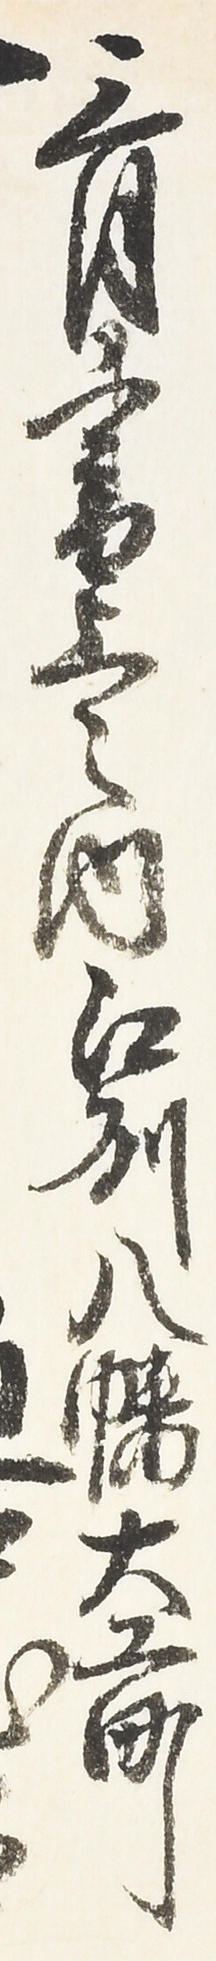三月書上之内江州八幡大工町
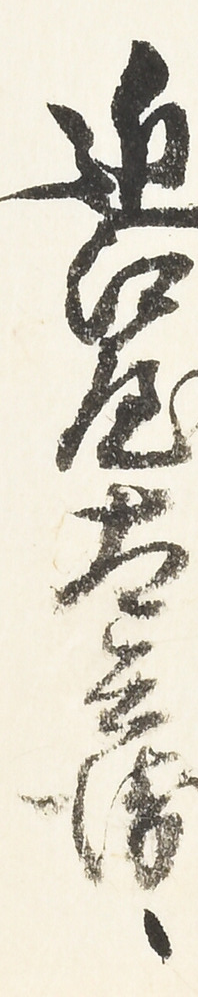一近江屋太兵衛・
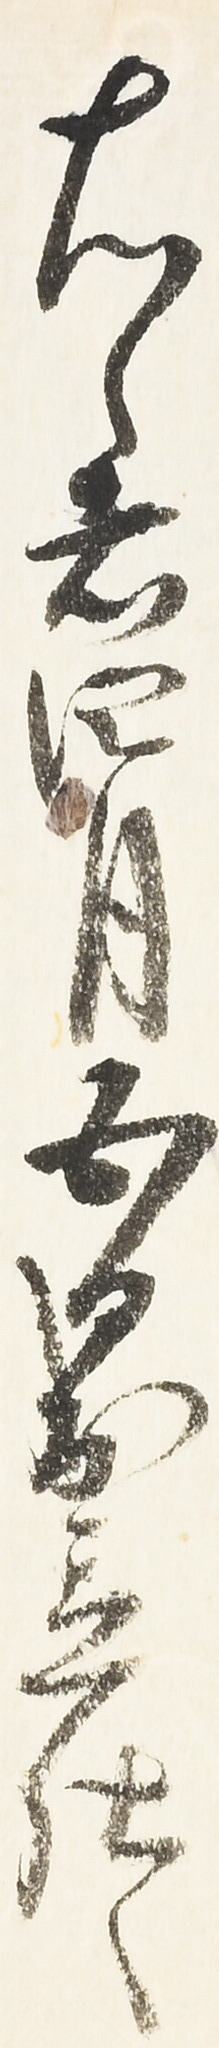右之者四月五日出立仕候
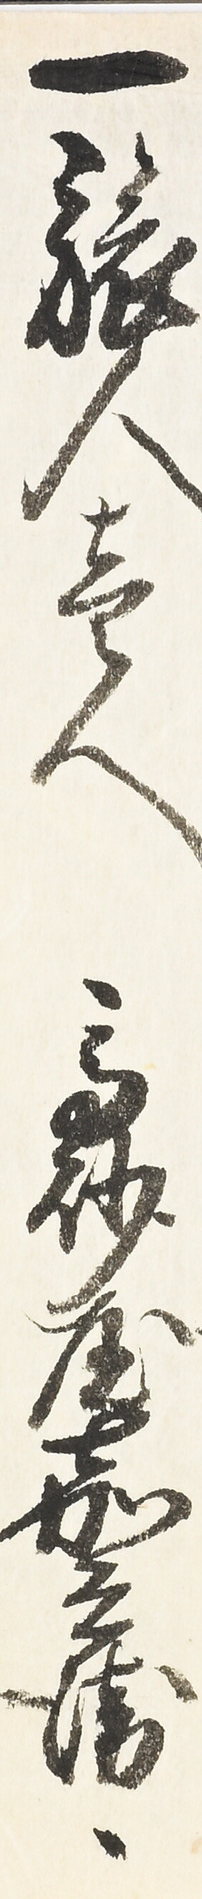一旅人壱人高砂屋嘉兵衛・
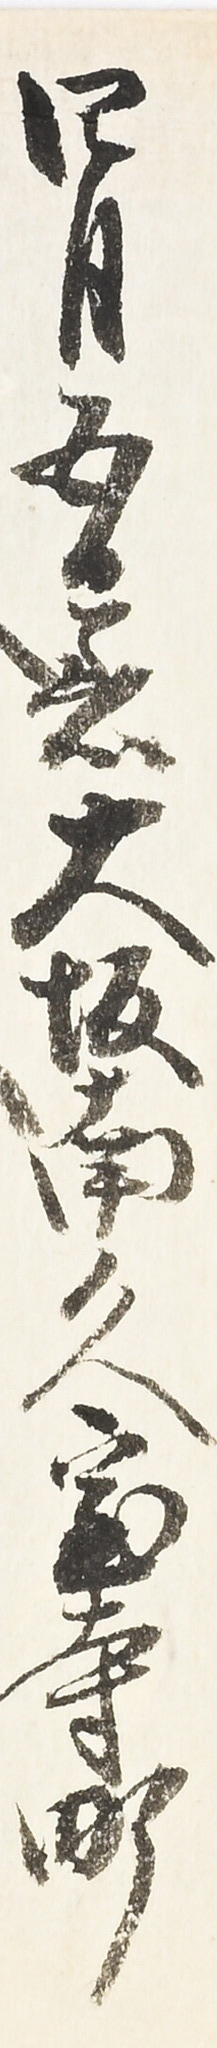四月五日着大坂南久宝寺町
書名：町中旅人泊控帳
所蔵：伊那市立高遠町図書館・合同会社AMANE
